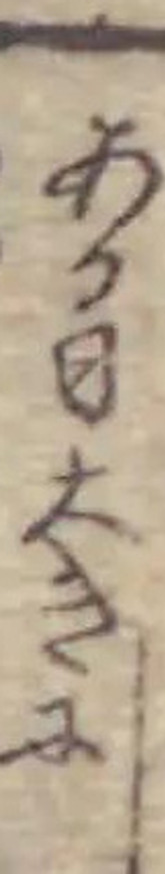ある日大きに
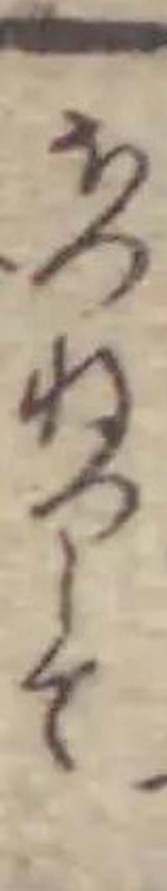ほつねつして
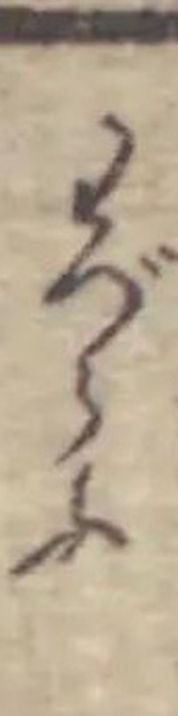わづらふ
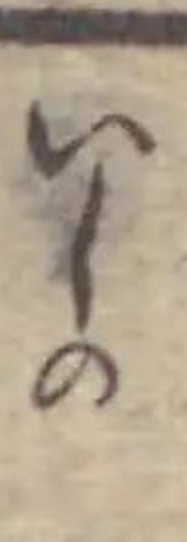いしの
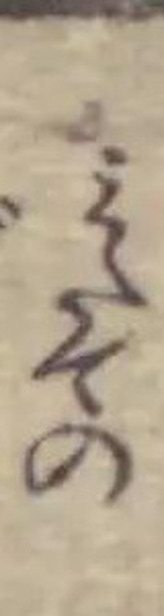みたての
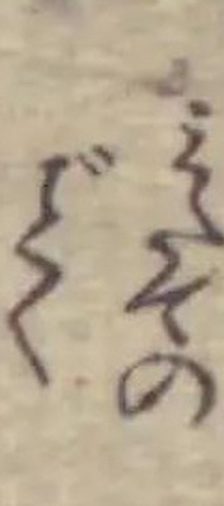ごとく
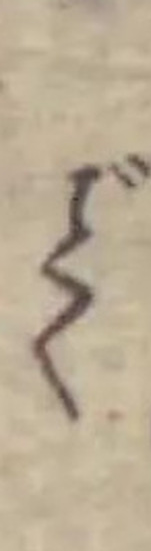ごとく
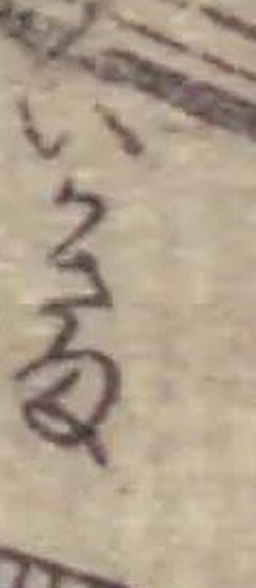いかさま
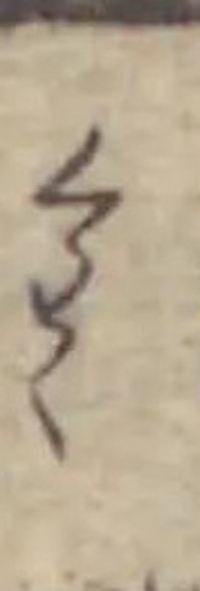くわく
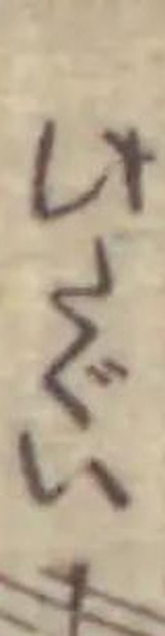此たぐい
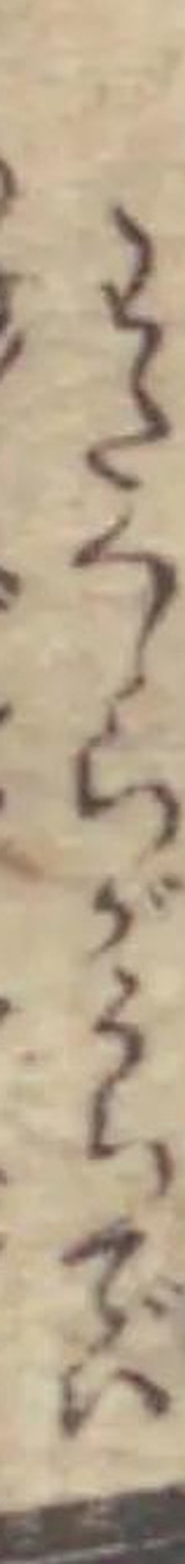わたくしらがうちでは
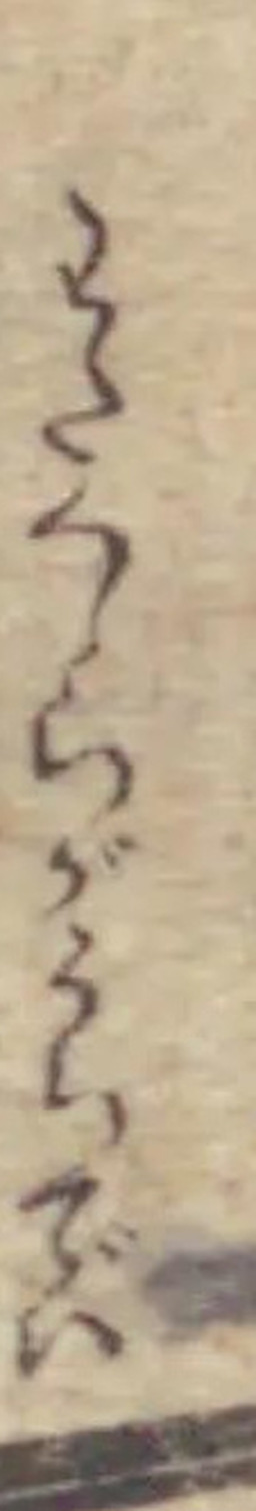わたくしらがうちでは
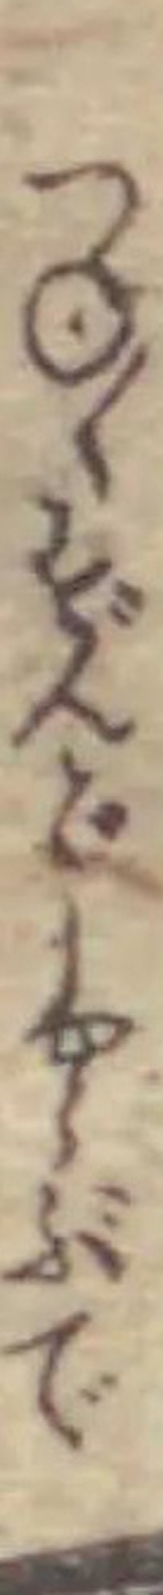つね〳〵ずんどしやうぶで
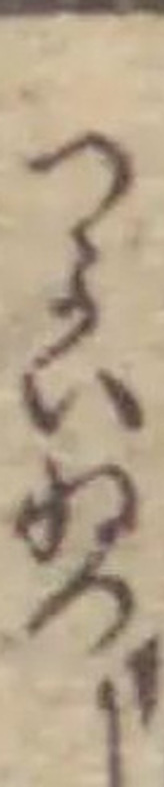つよいねつ
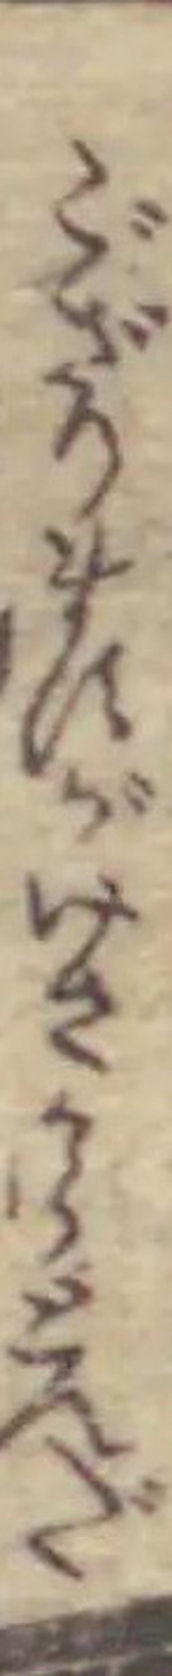ござりますがけさからとんだ
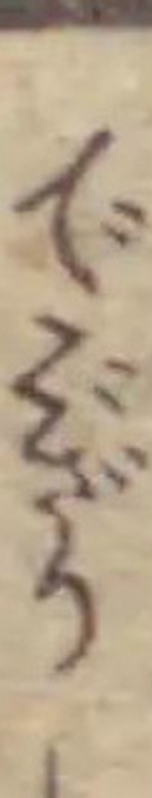でござり
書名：鬼子宝 3巻
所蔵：国立国会図書館 National Diet Library, JAPAN
